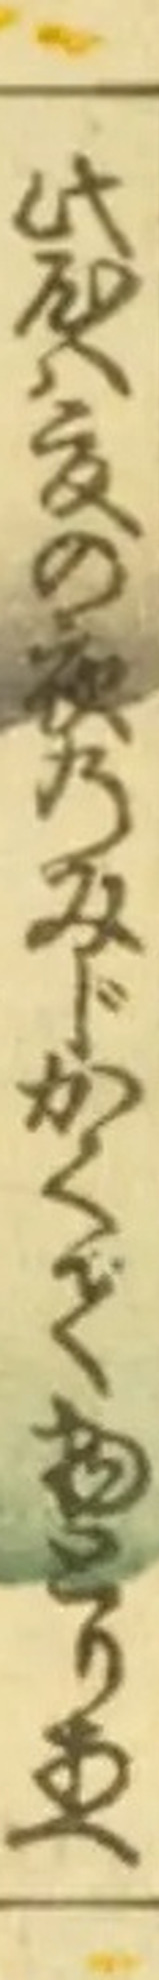此心は夏の夜のみじかくて物とりあへ
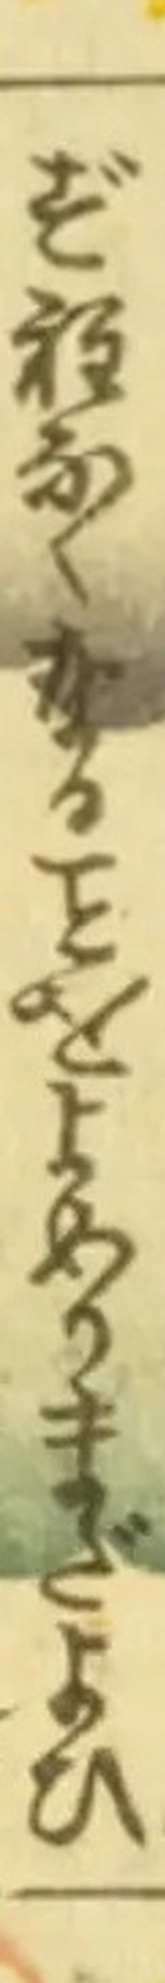ず程なくなることをよめりまだよひ
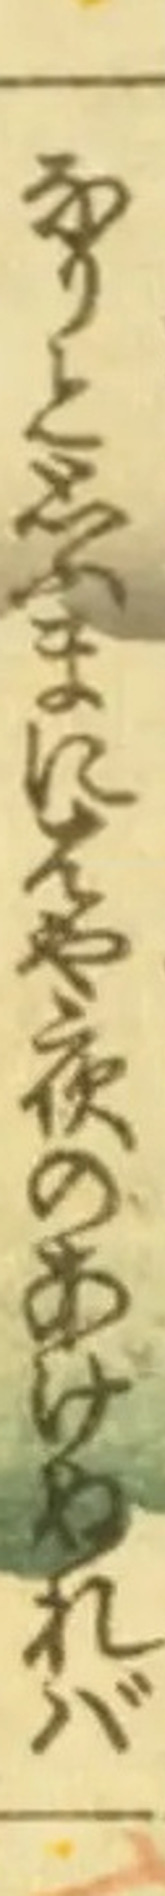なりと思ふまにはや夜のあけぬれば
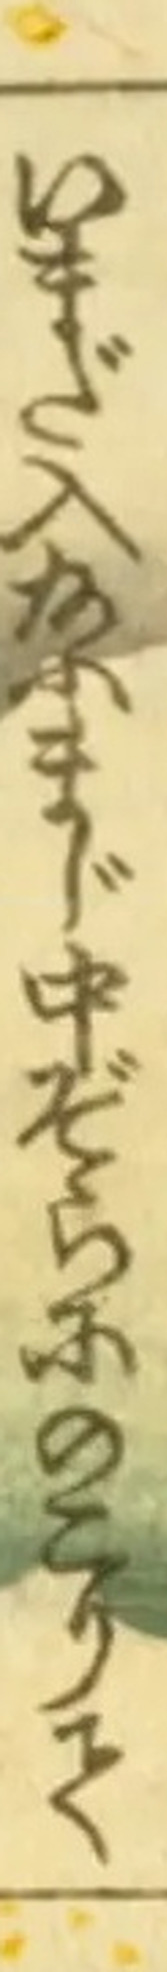いまだ入給ふまじ中ぞらにのこりて
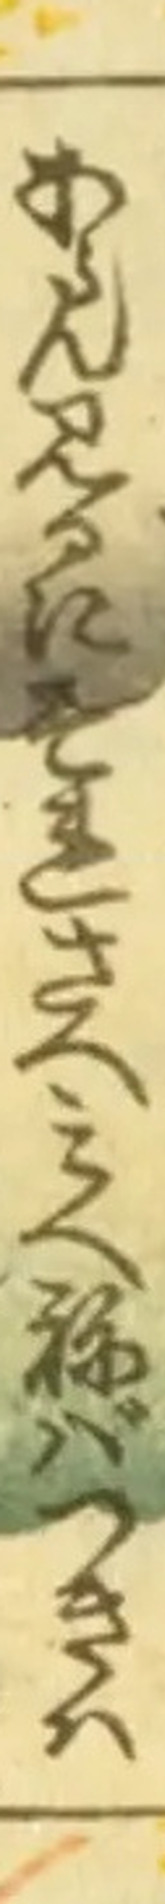あらん見るにそれさへみへねばつきは
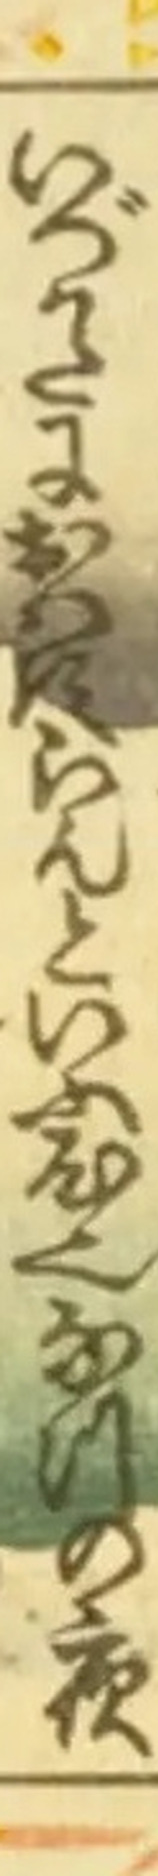いづかたにおはすらんといふ心也なつの夜
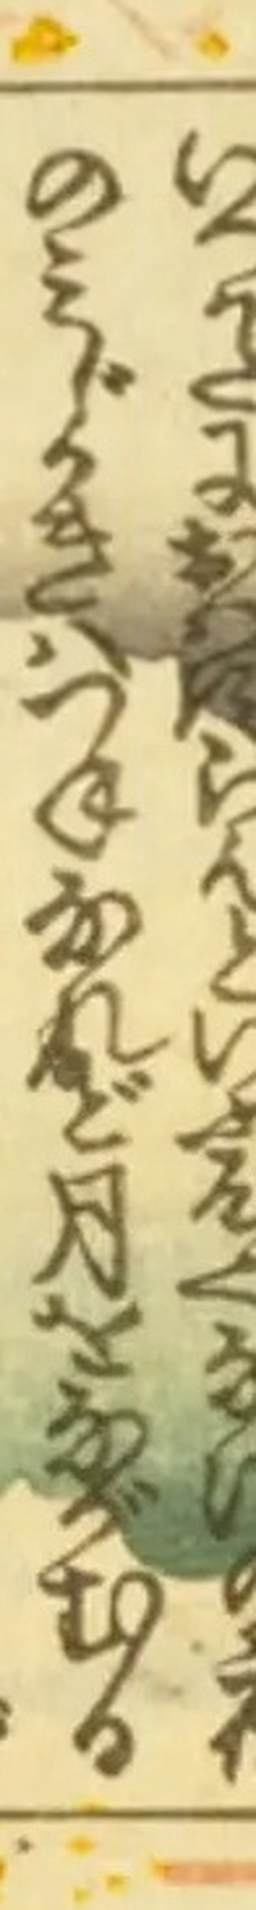のみじかきはつねなれど月をながむる
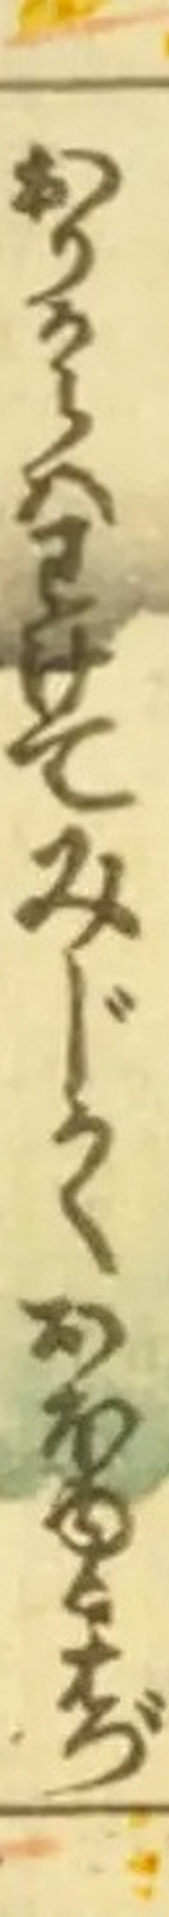おりからはわけてみじかくおほゆるはづ
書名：百人一首絵抄 三十五 清原深養父
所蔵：国立国会図書館 National Diet Library, JAPAN
